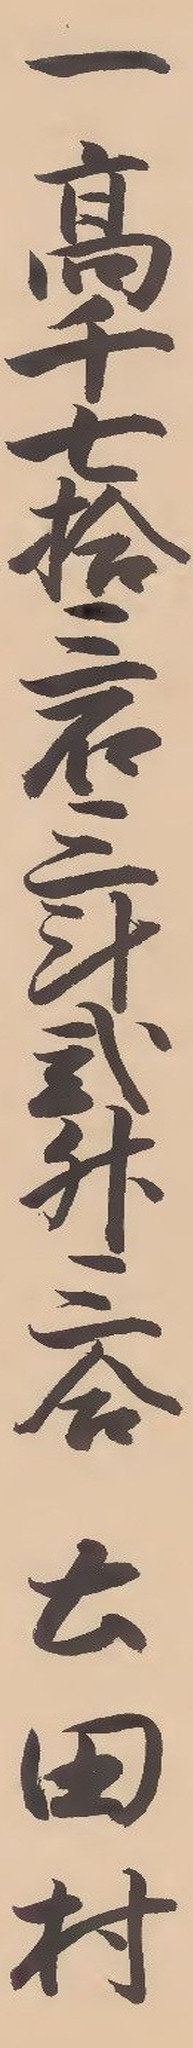一髙千七拾三石三斗弐升三合土田村
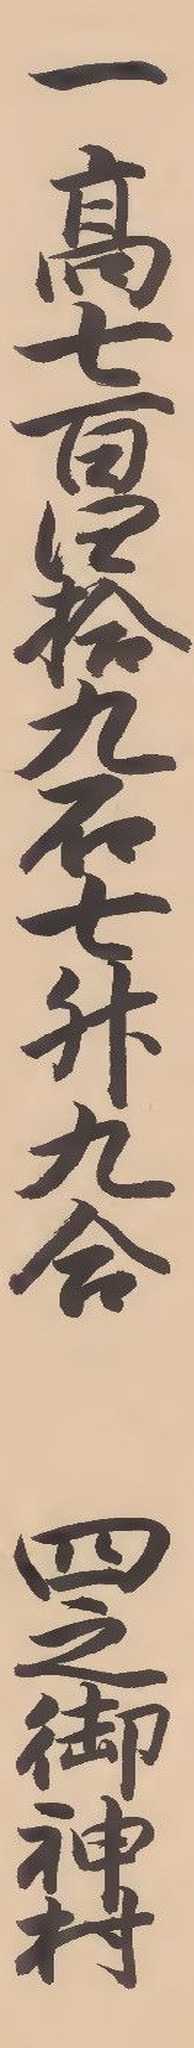一髙七百四拾九石七升九合四之御神村
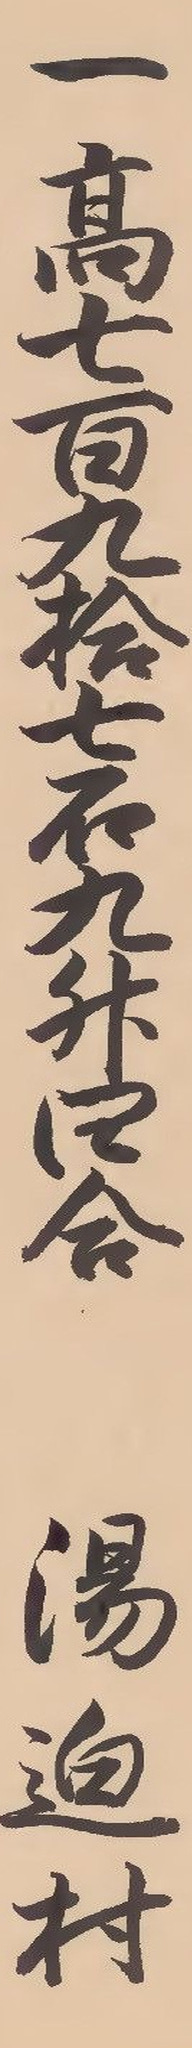一髙七百九拾七石九升四合湯迫村
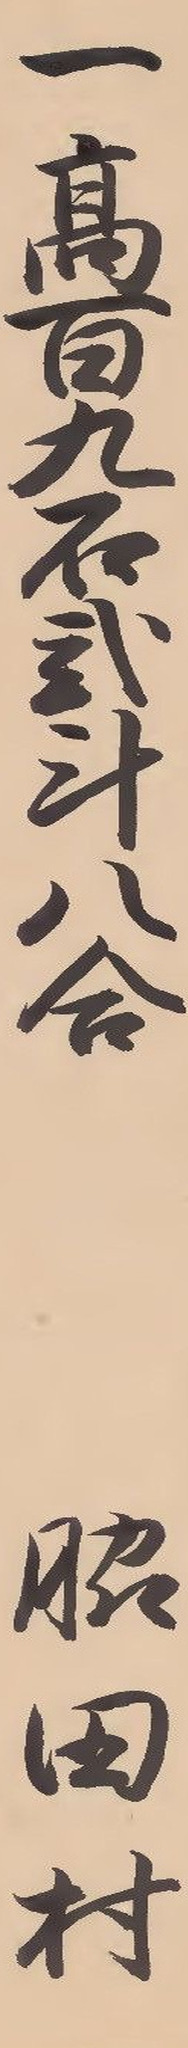一髙百九石弐斗八合脇田村
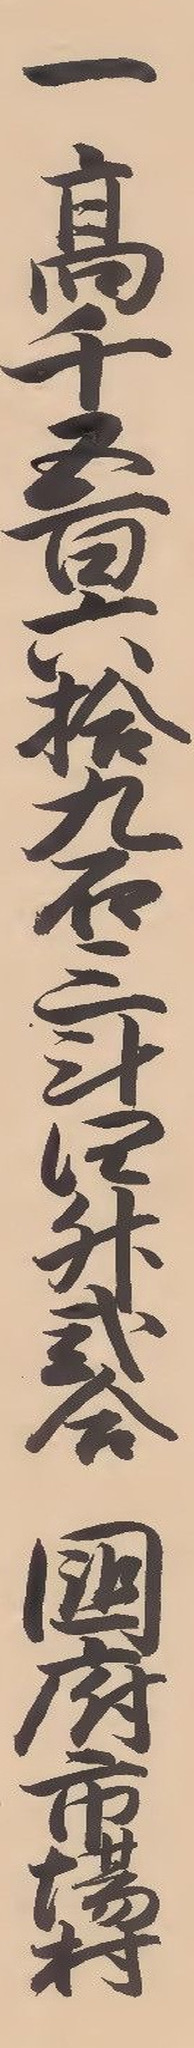一髙千五百六拾九石三斗四升弐合國府市場村
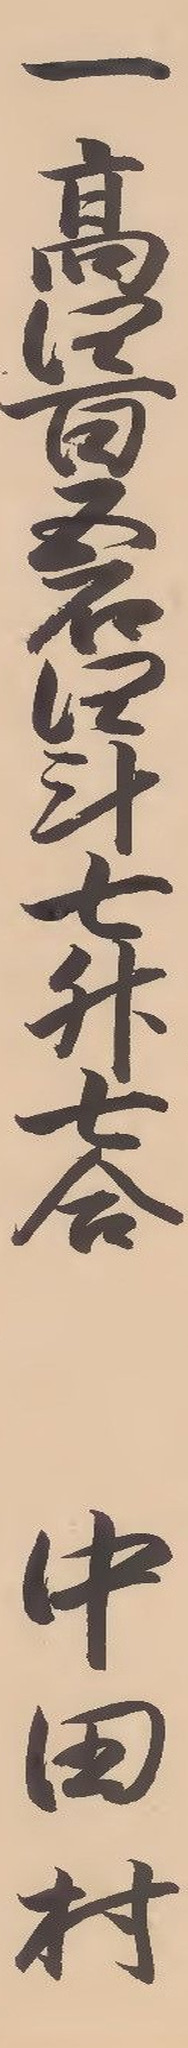一髙四百五石四斗七升七合中田村
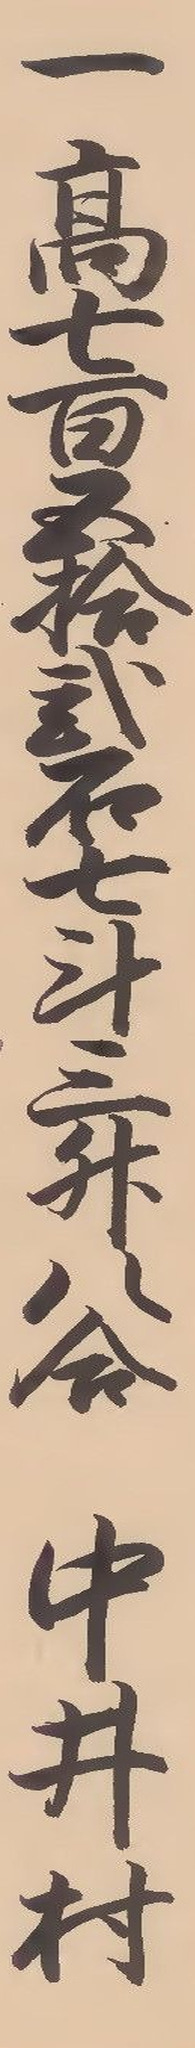一髙七百五拾弐石七斗三升八合中井村

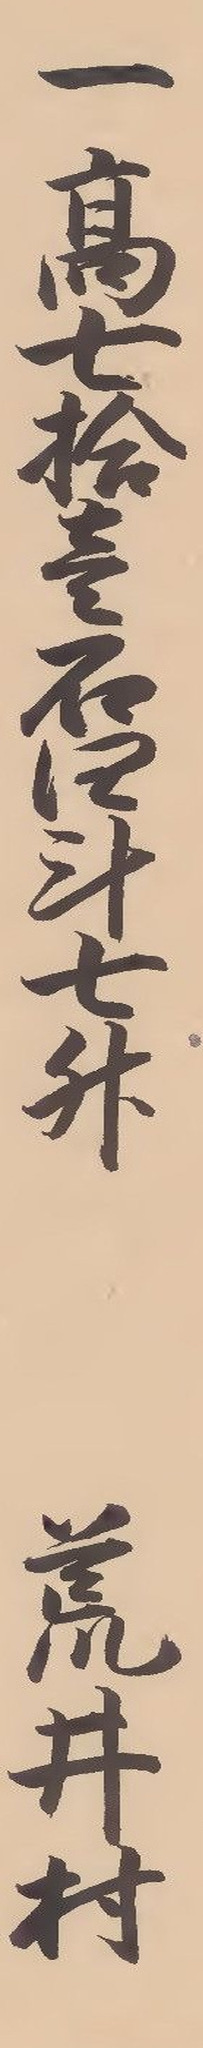一髙七拾壱石四斗七升荒井村
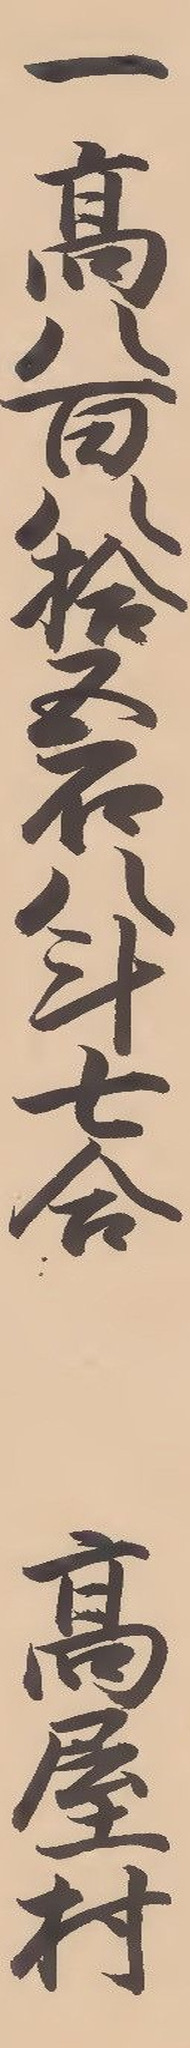一髙八百八拾五石八斗七合髙屋村
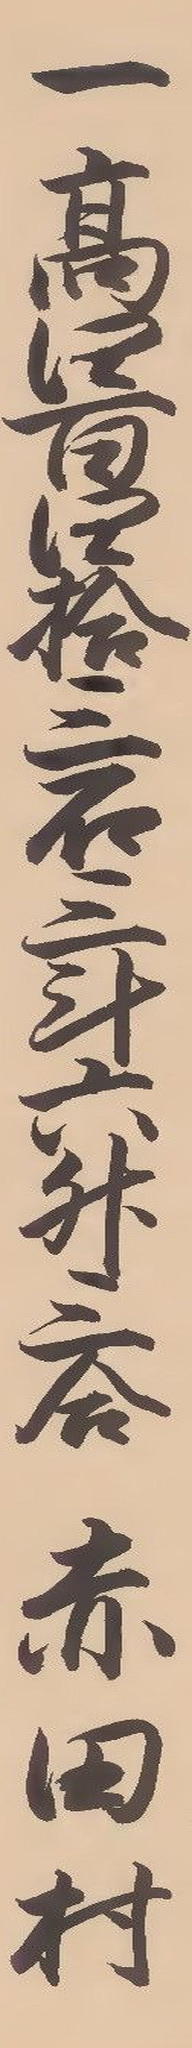一髙四百四拾三石三斗六升三合赤田村
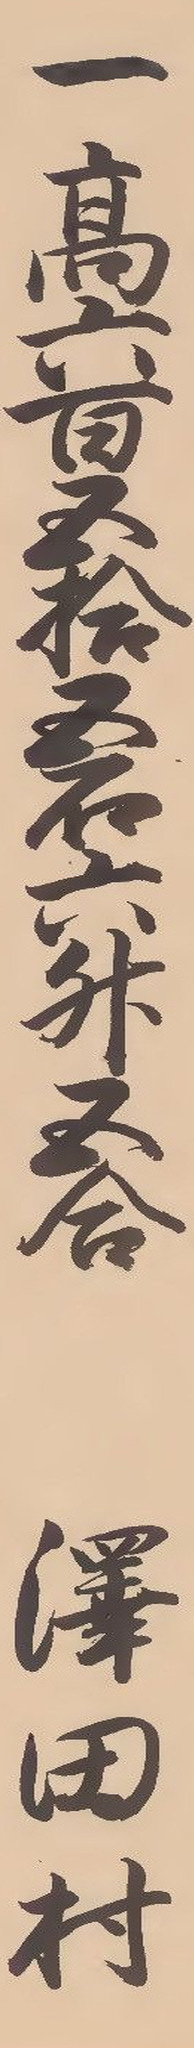一髙六百五拾五石六升五合澤田村
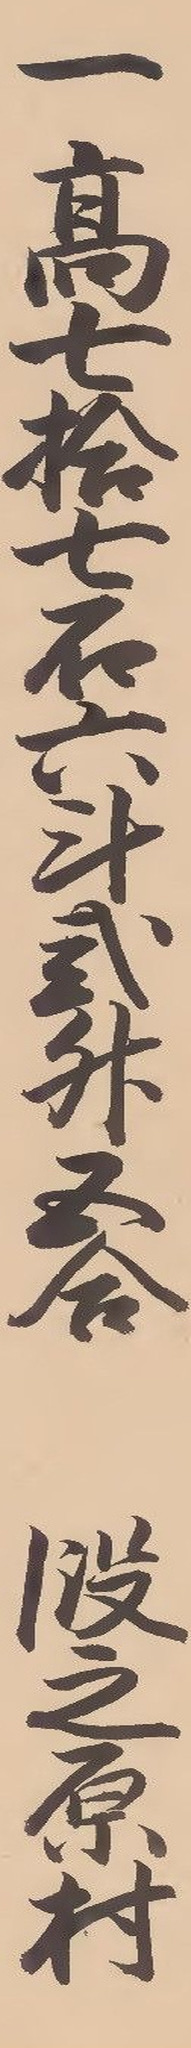一髙七拾七石六斗弐升五合段之原村
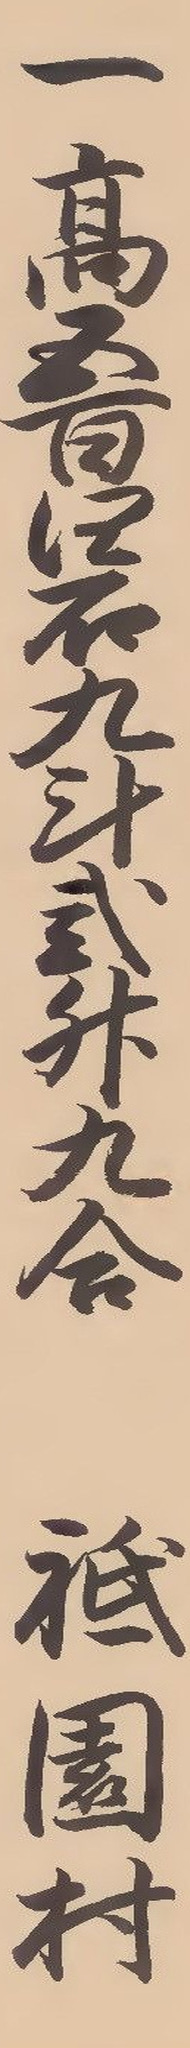一髙五百四石九斗弐升九合祇園村
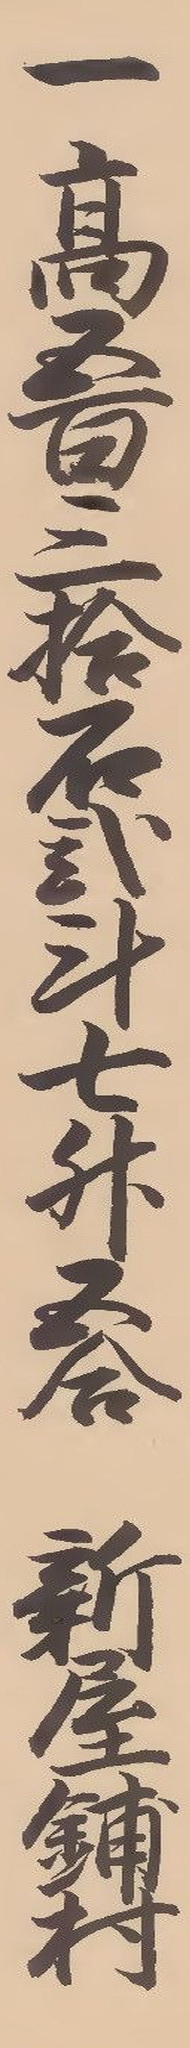一髙五百三拾石弐斗七升五合新屋鋪村
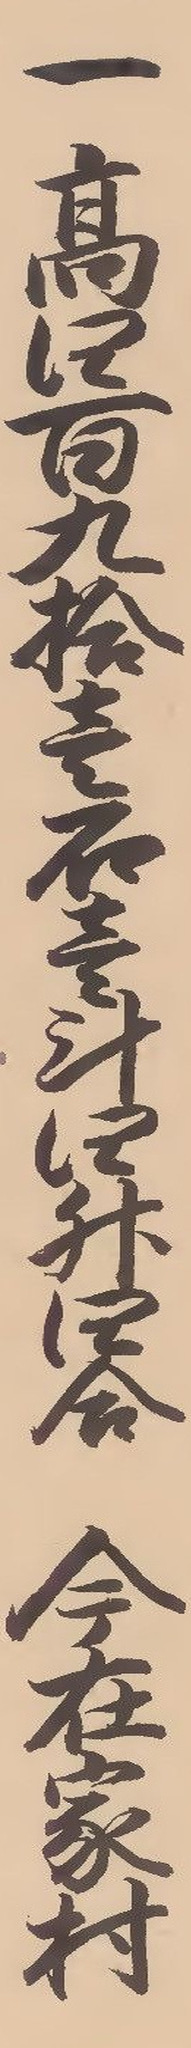一髙四百九拾壱石壱斗四升四合今在家村

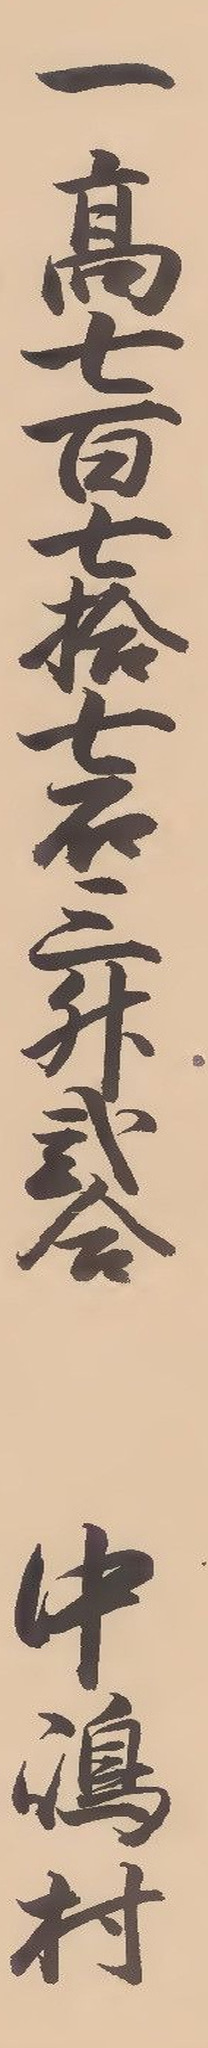一髙七百七拾七石三升弐合中嶋村
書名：備前国郷帳
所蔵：国立公文書館 National Archives of Japan
